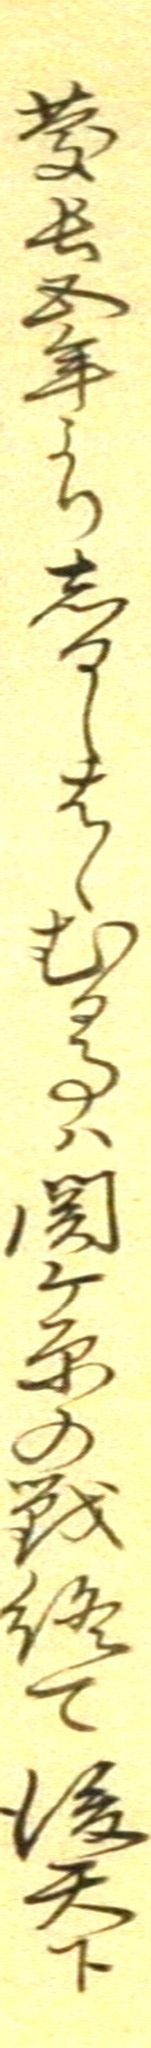慶長五年よりしるしはしむる事は関ケ原の戦終て後天下
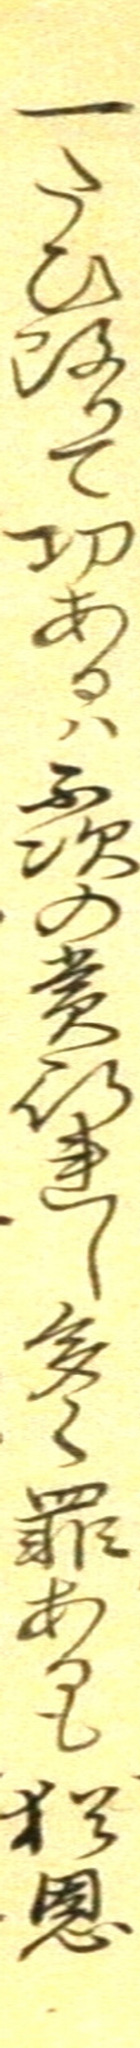一たひ改りて功あるは不次の賞行れし多く罪あるも猶恩
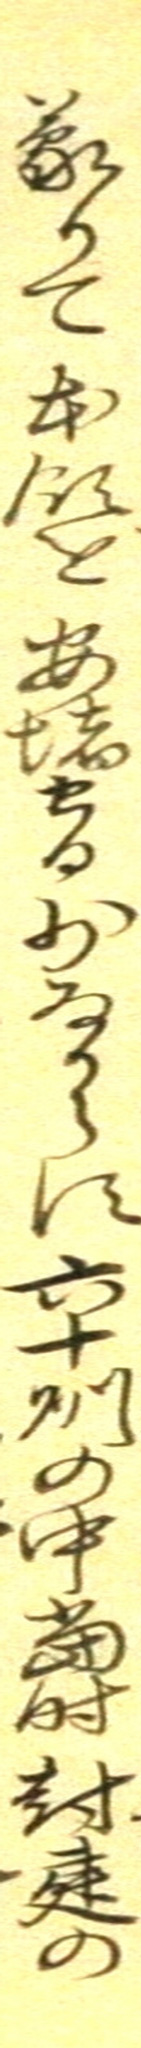蒙りて本領を安堵せる少なからす六十州の中当時封建の
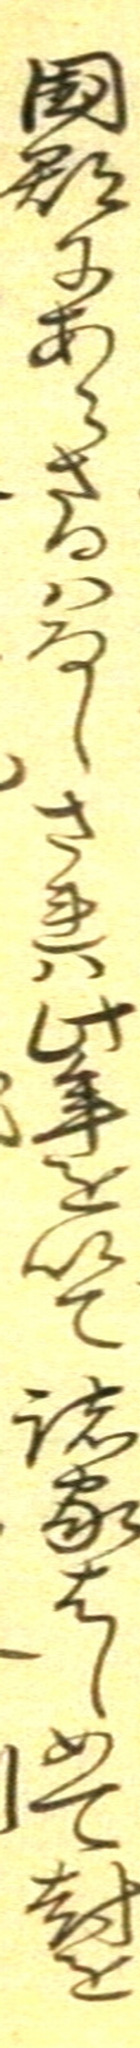国郡にあらさるはなしされは此年を以て諸家はしめて封を
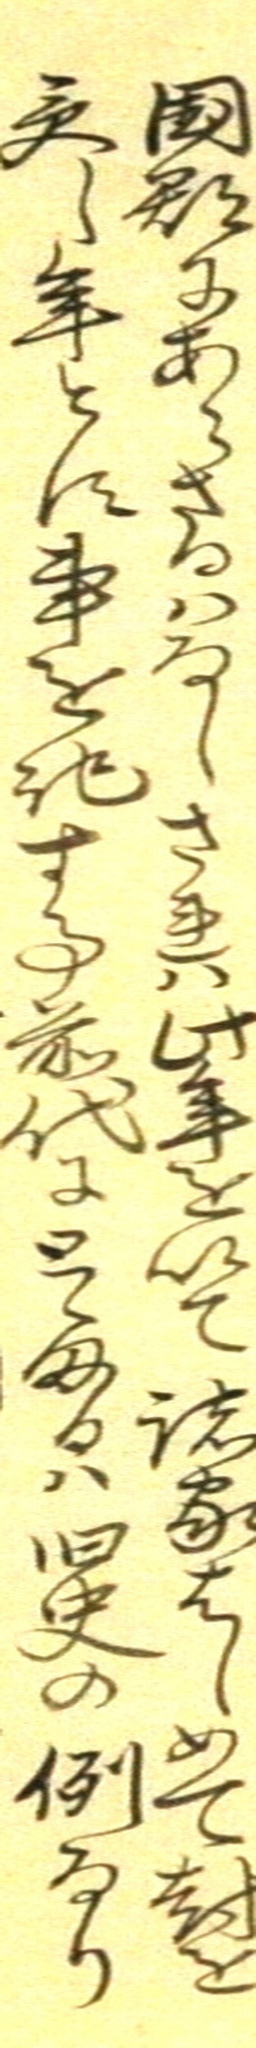受し年とす事を記す事前代にとゝまるは旧史の例なり
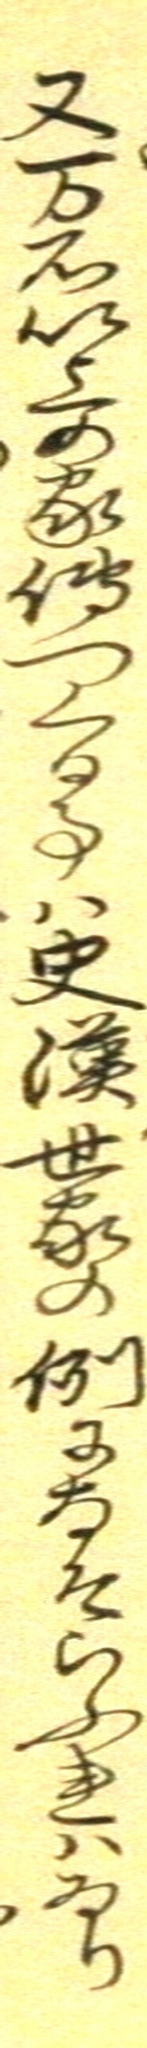又万石以上の家伝つくる事は史漢世家の例になそらふれはなり
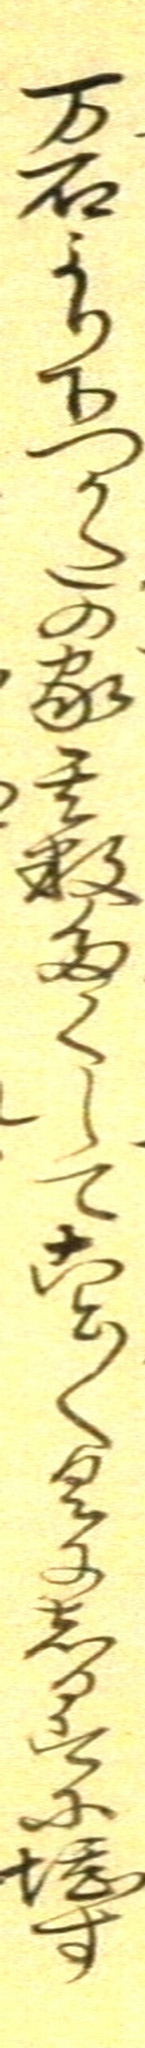万石より下つかたの家其数多くしてこと〳〵くにしるすに堪す
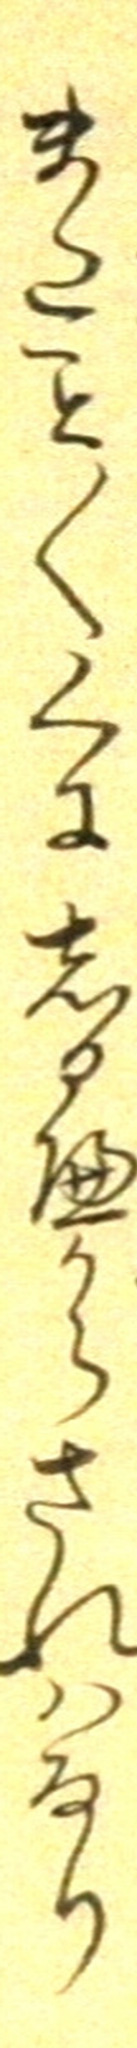またこと〳〵くにしるへからされはなり
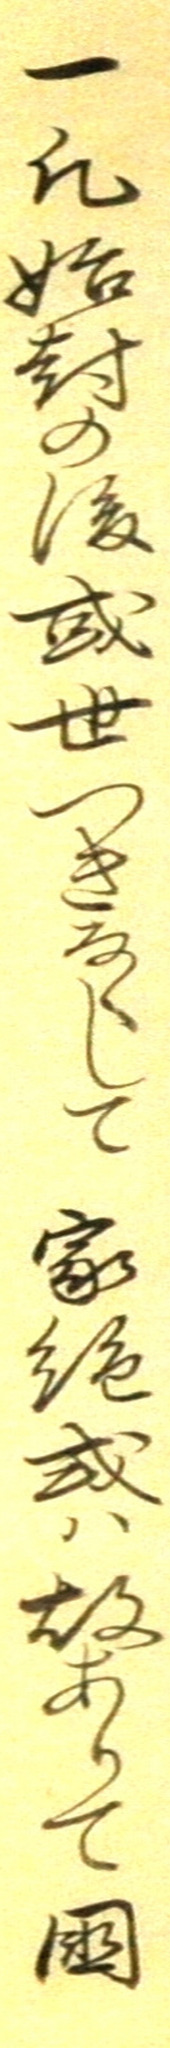一凡始封の後或世つきなくして家絶或は故ありて国
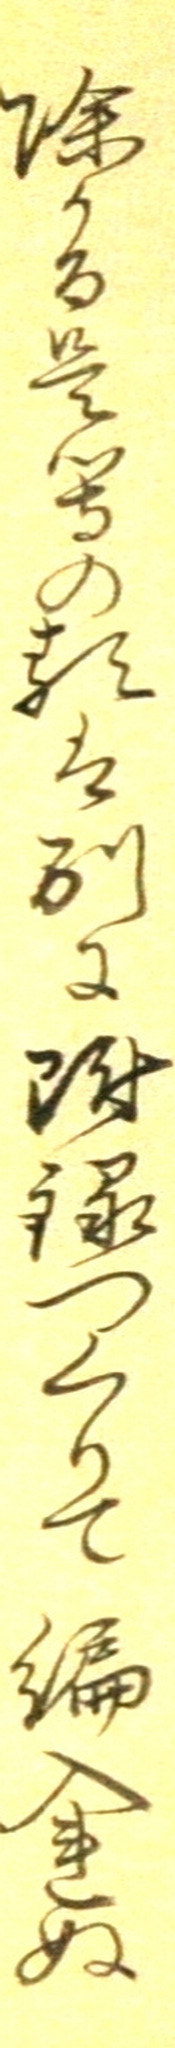除かる是等の類は別に附録つくりて編入れぬ

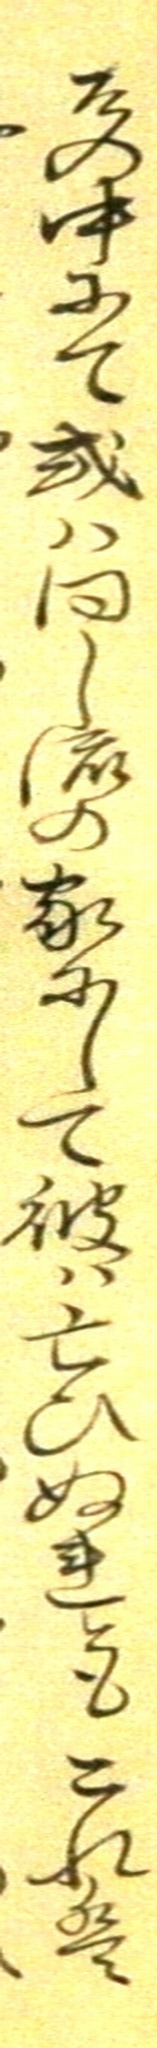その中にて或は同し流の家にして彼は亡ひぬれともこれは
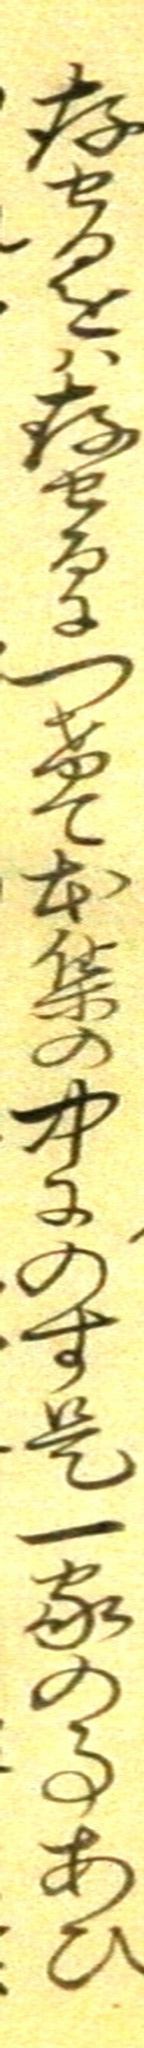存せるをは存せるにつけて本集の中にのす是一家の事あひ
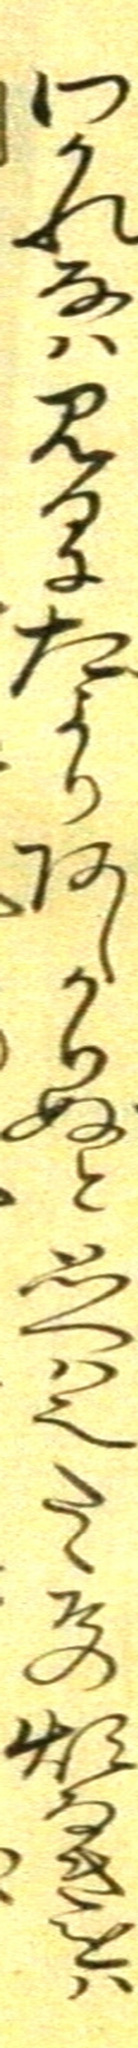わかれなは見るにたよりあしからぬと思へは也たゝその煩なきをは
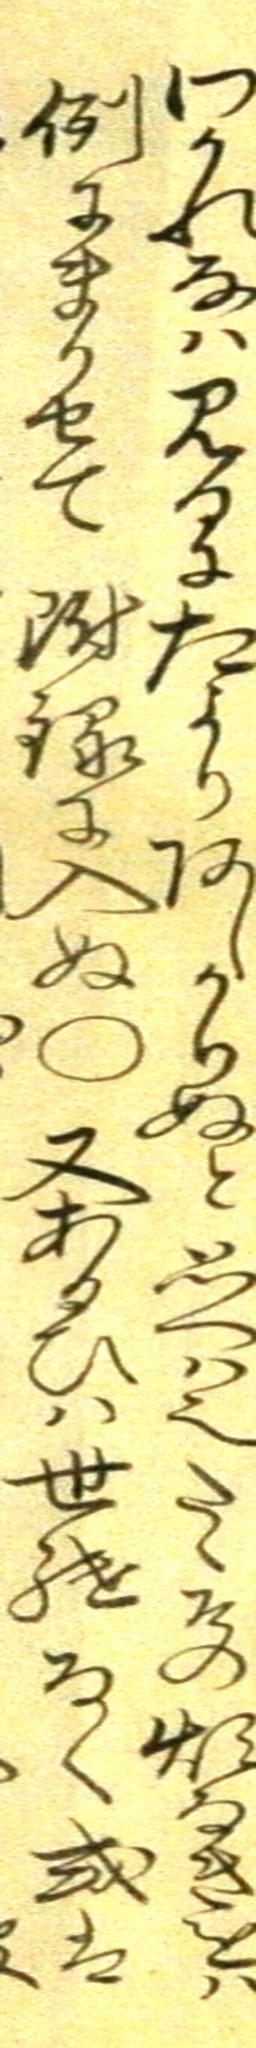例にまかせて附録に入ぬ○又あるひは世継なく或は
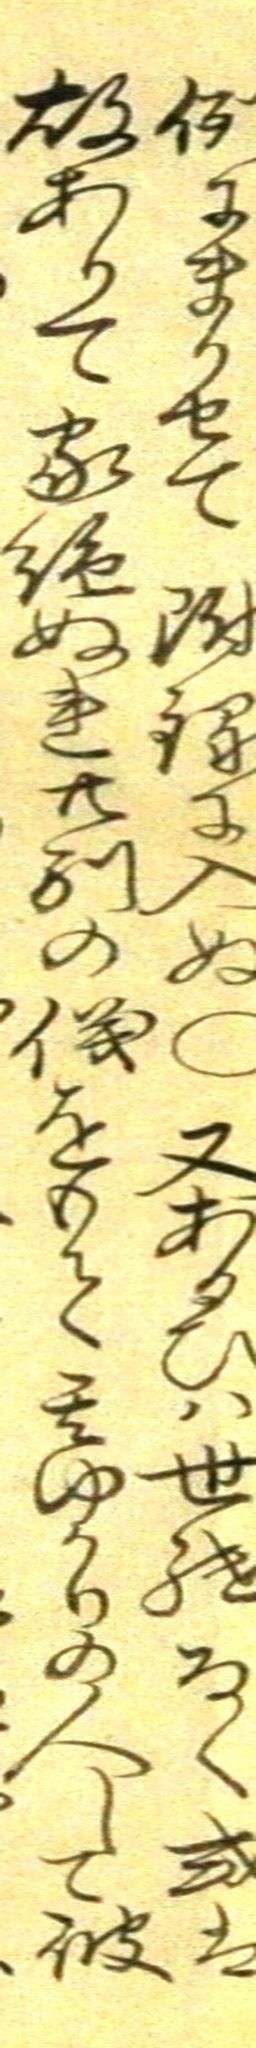故ありて家絶ぬれ共別の儀をもて其ゆかりの人して彼
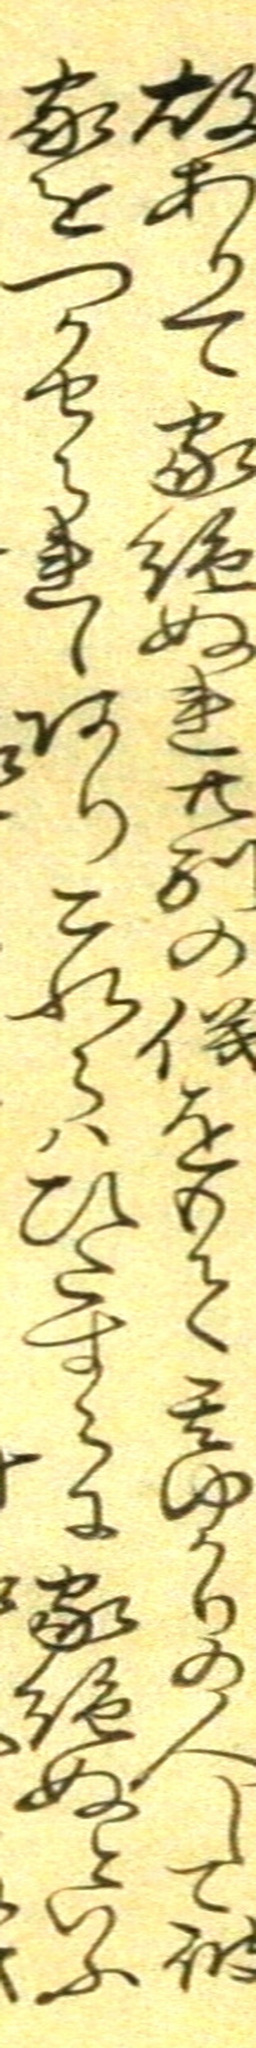家をつかせられしありこれらはひたすらに家絶ぬといふ
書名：藩翰譜（一）
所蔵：伊那市立高遠町図書館・合同会社AMANE
